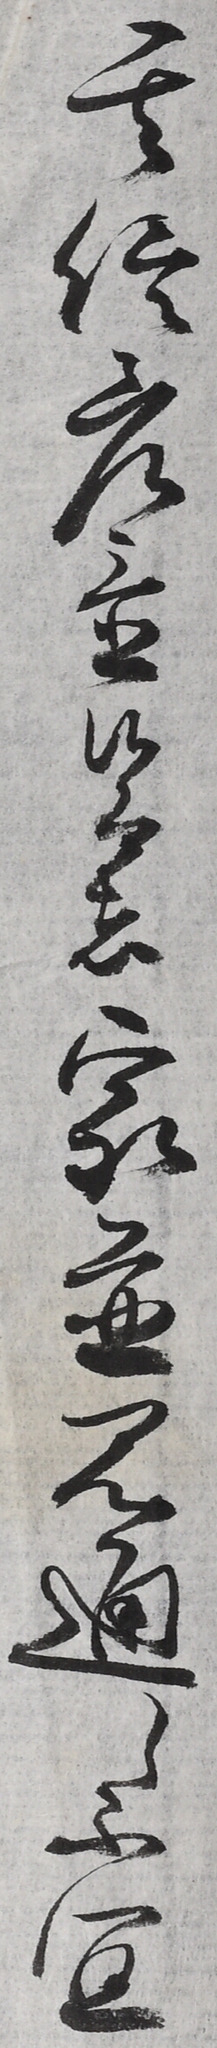其侭差置候而者家並見通し不宜
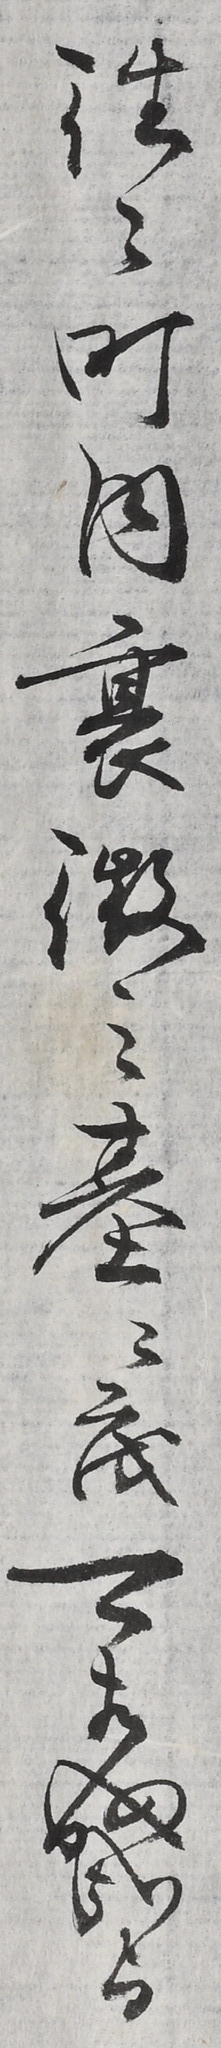往々町内衰微之基ニ茂可相成哉与
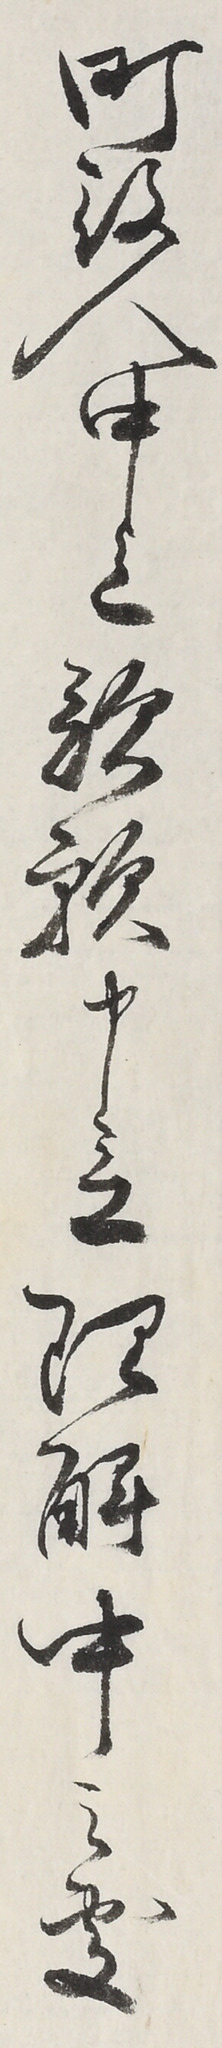町役人中迄歎願申上候理解中之処
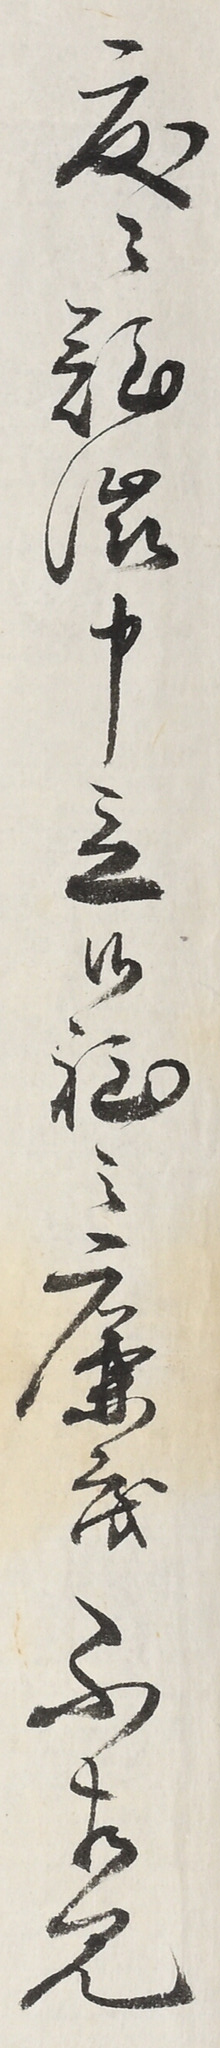度々難渋申立候程之廉茂不相見
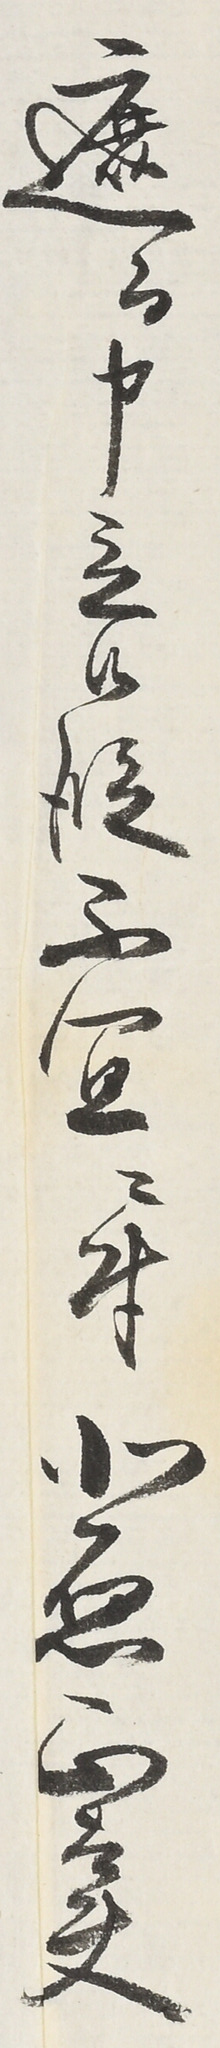遮而申立候段不宜ニ付北原正太夫
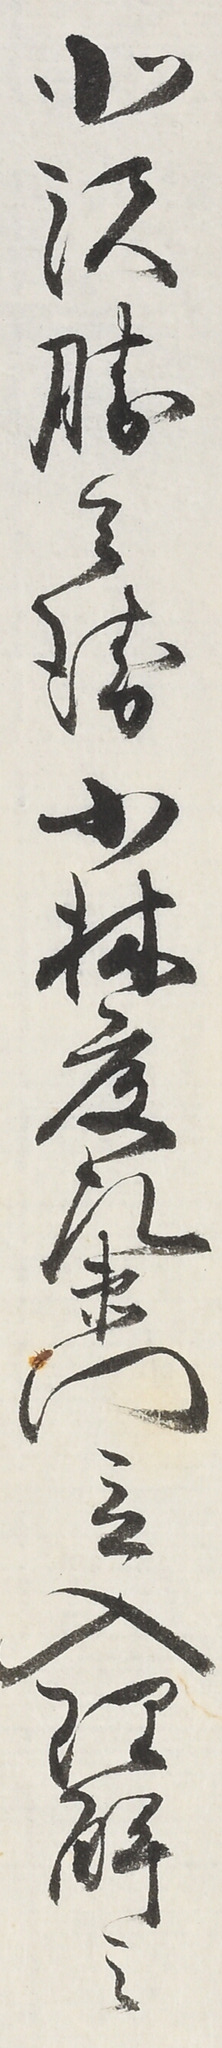北沢勝兵衛小林彦左衛門立入理解之
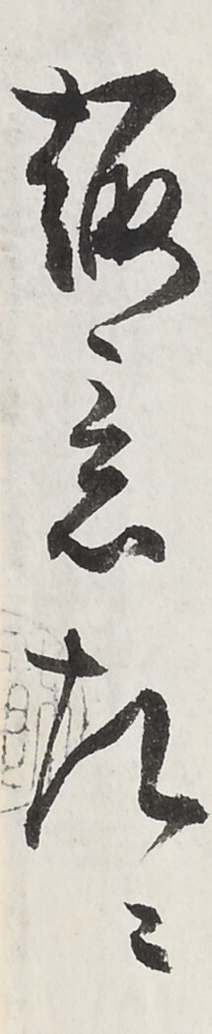趣意左ニ
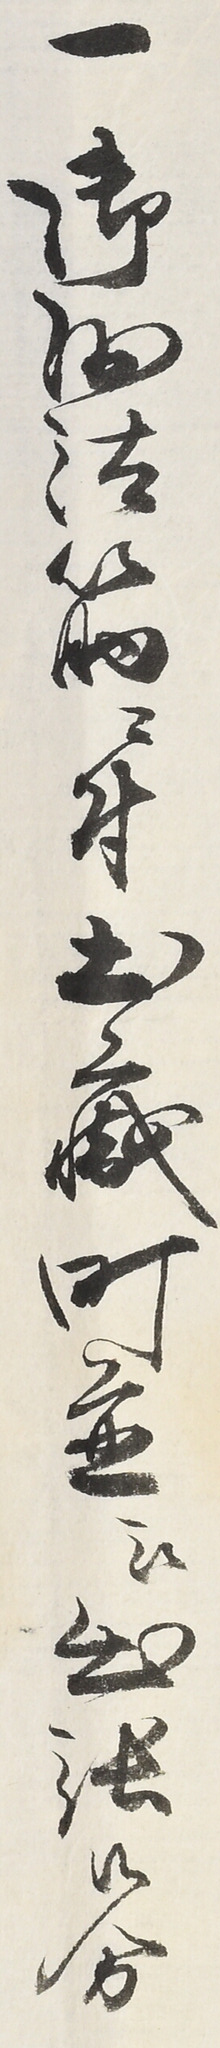一御沙汰筋ニ付土蔵町並江出張候分
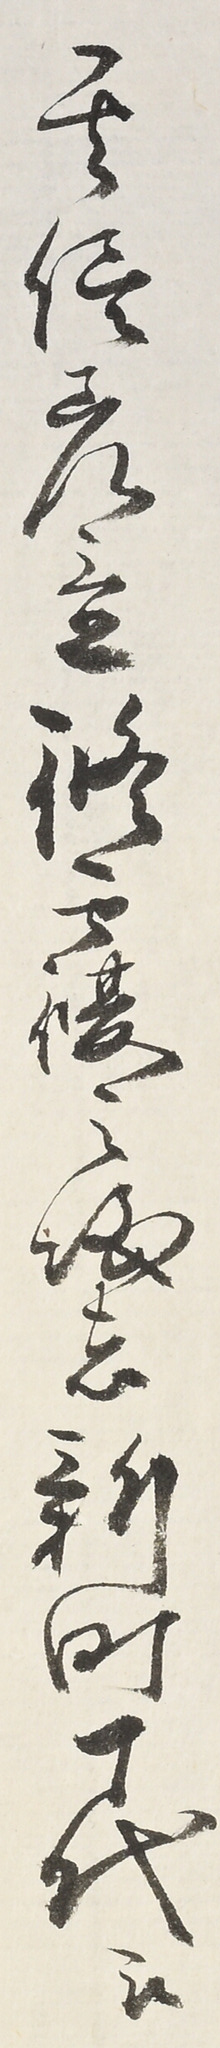其侭差置修覆之儀者新町丁代江
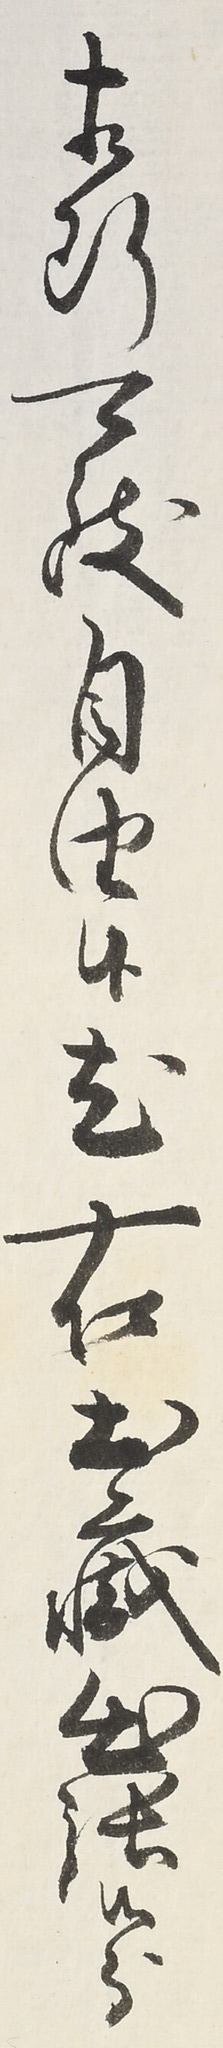相断可致自由候尤右土蔵出張候分
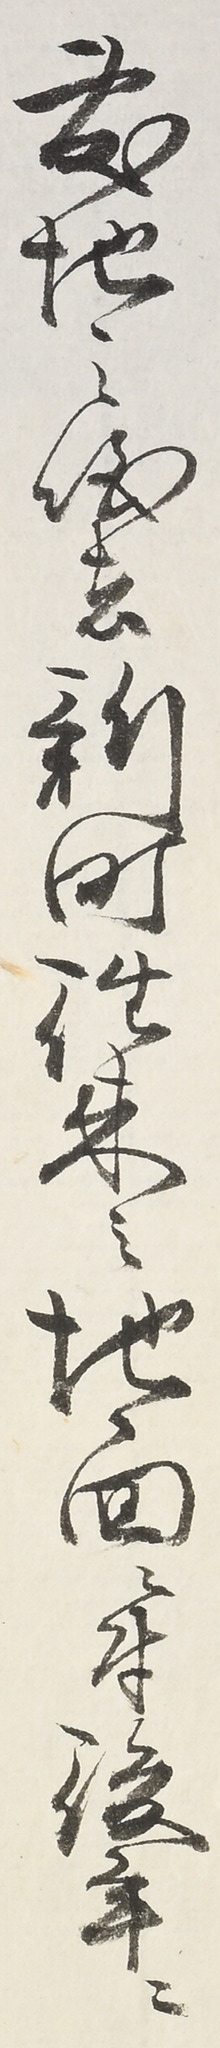敷地之儀者新町往来之地面ニ付後年ニ
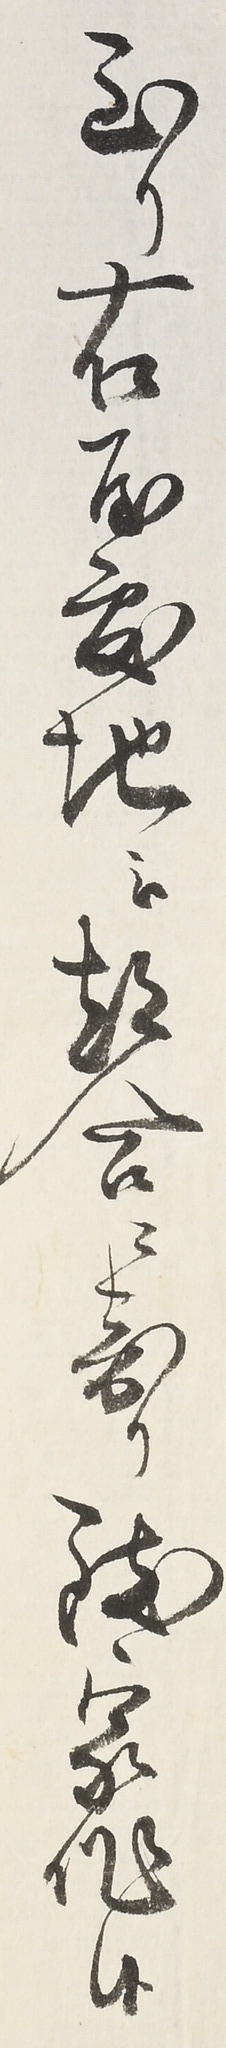至り右屋敷地江都合ニ寄り致家作候
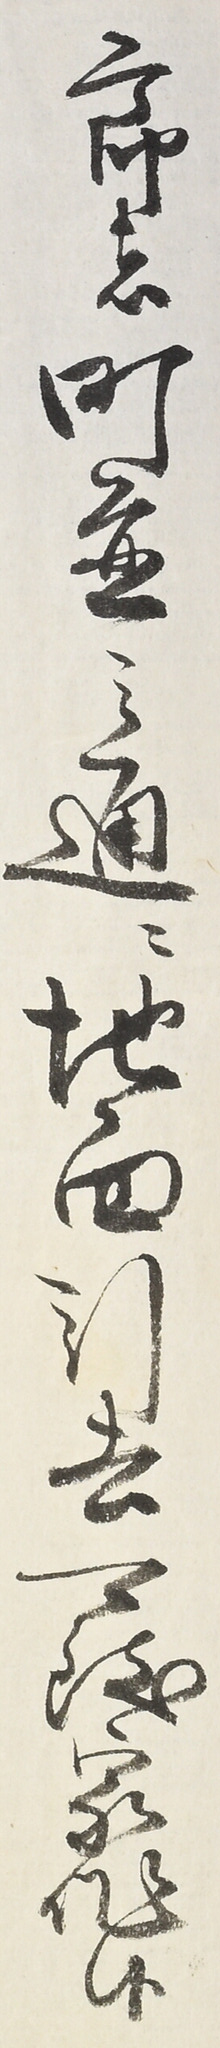節者町並之通ニ地面引去可致家作候
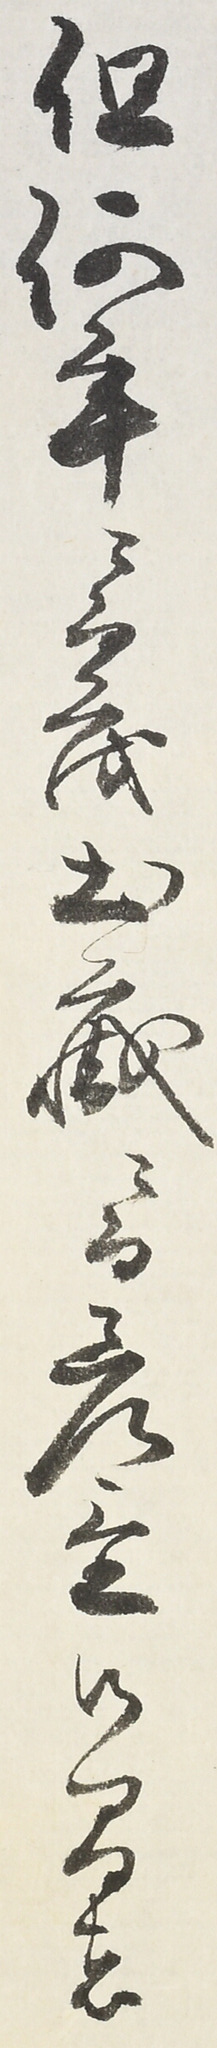但何年ニ茂土蔵ニ而差置候間者
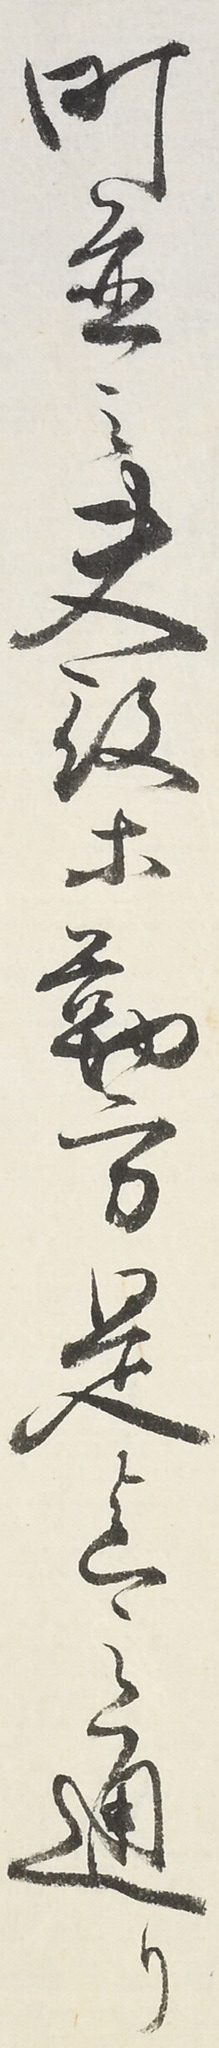町並之夫役等勤方是迄之通り
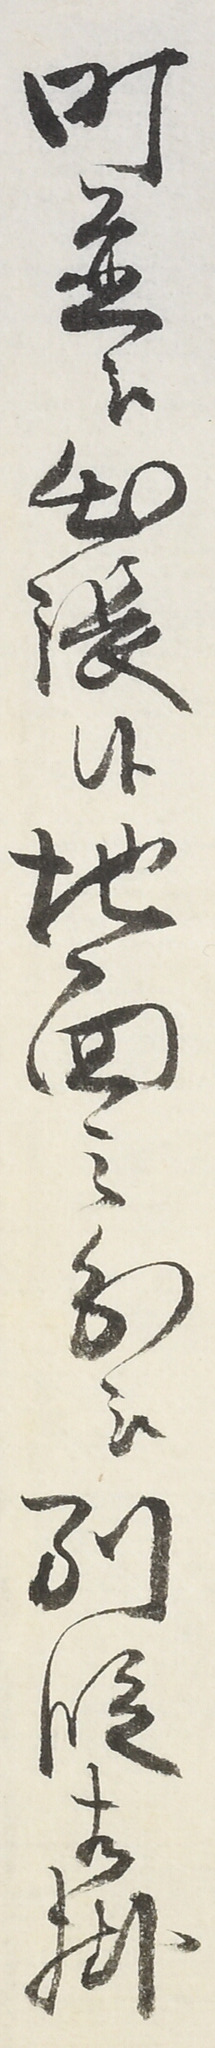町並江出張候地面之分江別段相掛
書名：為取替一札之事
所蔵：伊那市立高遠町図書館・合同会社AMANE
